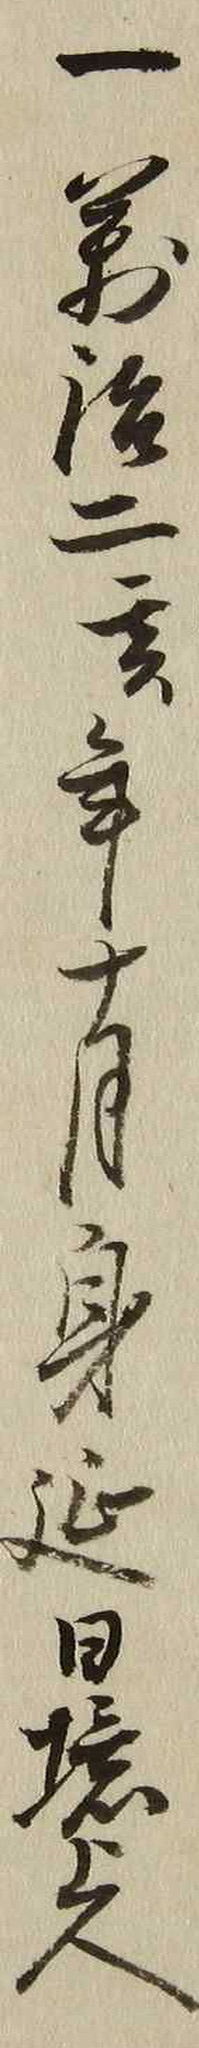一万治二亥年十月身延日境上人
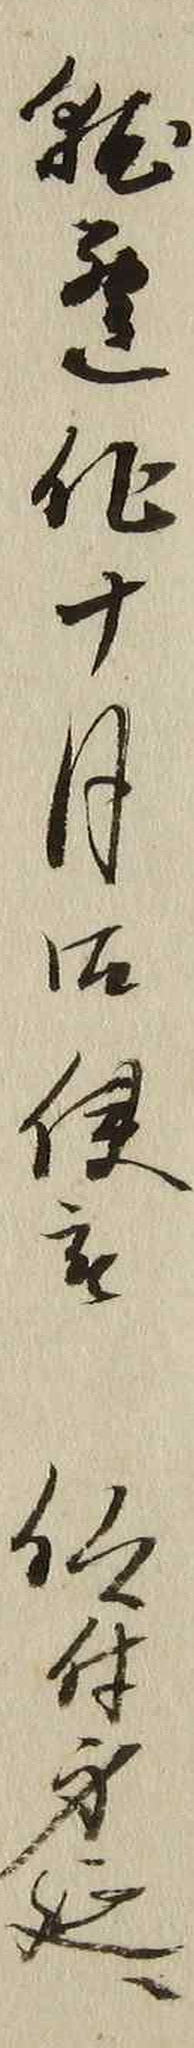就遷化十月御使被仰付身延へ
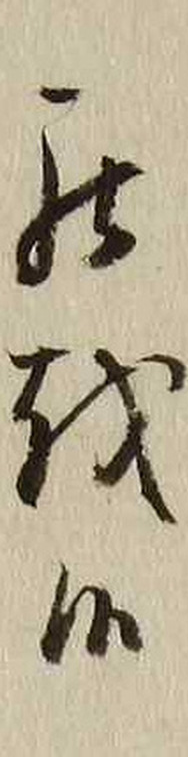罷越候
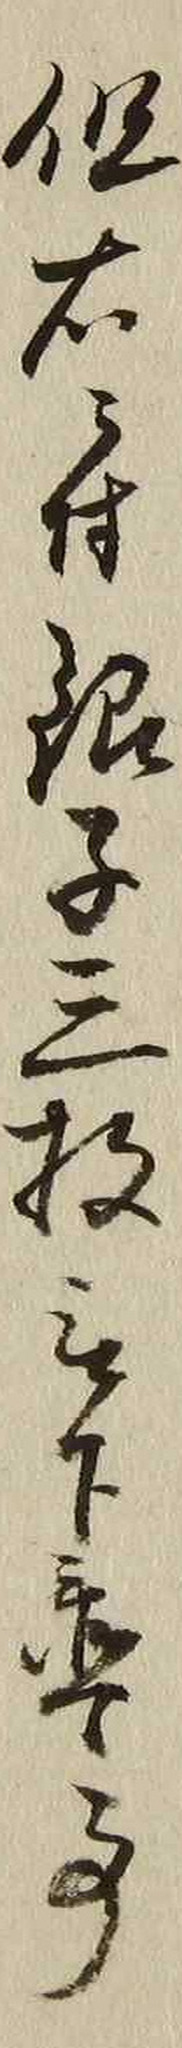但右ニ付銀子三枚被下置候事
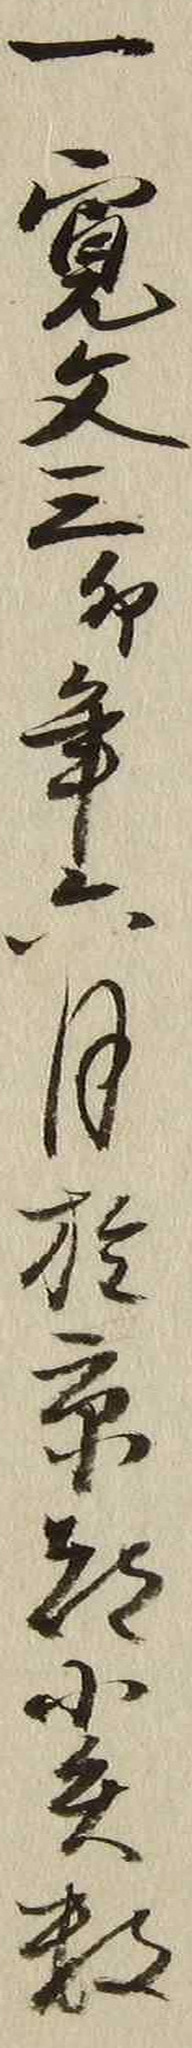一寛文三卯年六月於京都小矢数
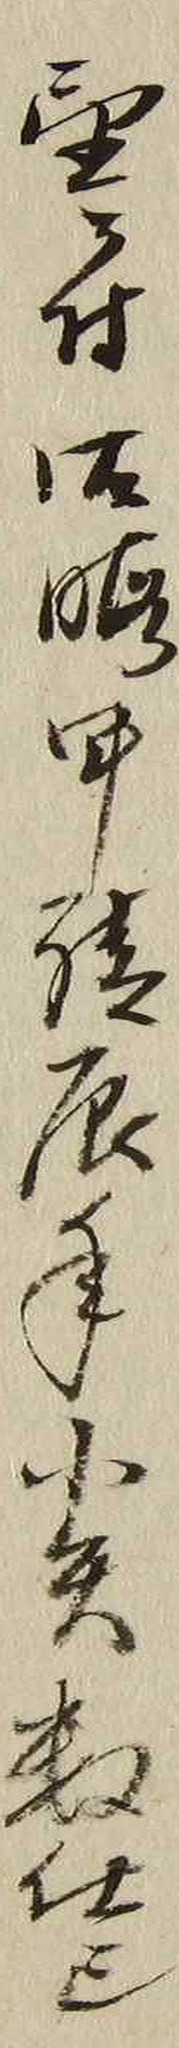望ニ付御暇申請辰年小矢数仕巳
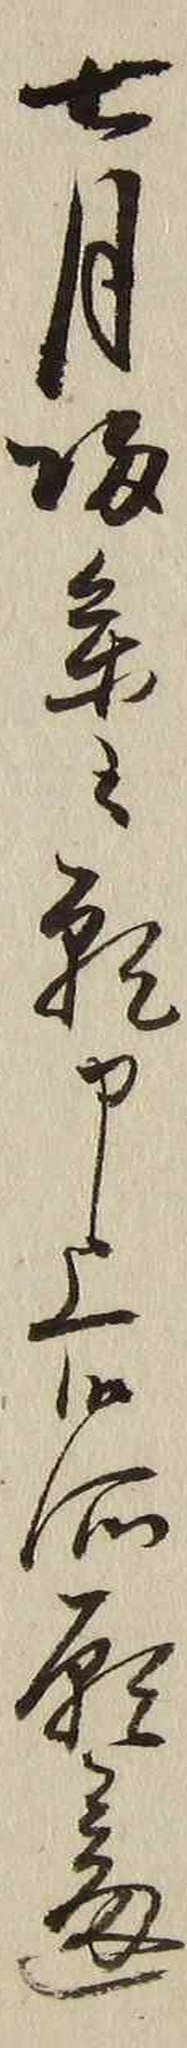七月帰参之願申上候所願之通
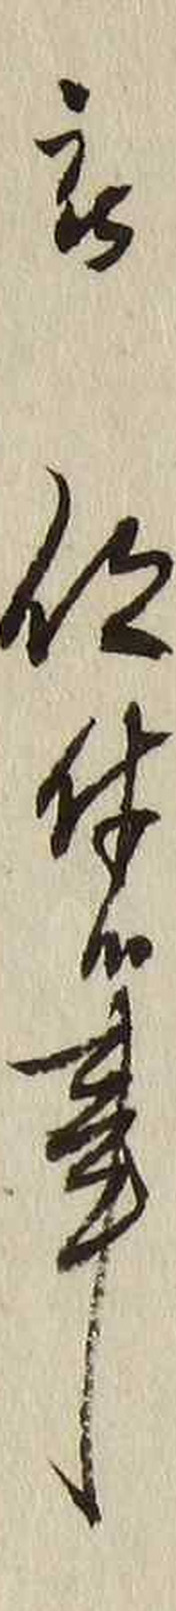被仰付候事
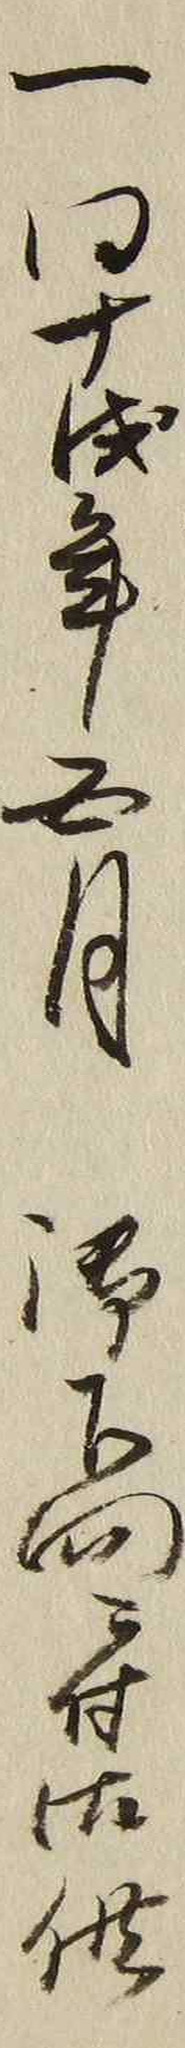一同十戌年五月御下向ニ付御供
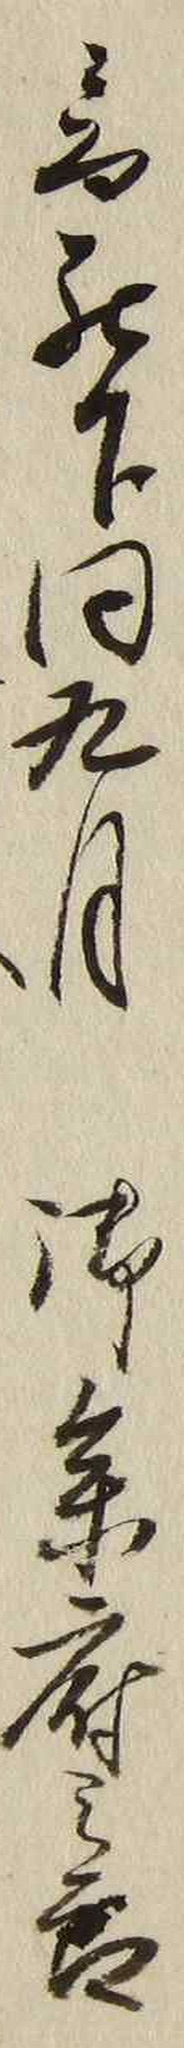ニ而罷下同九月御参府之節
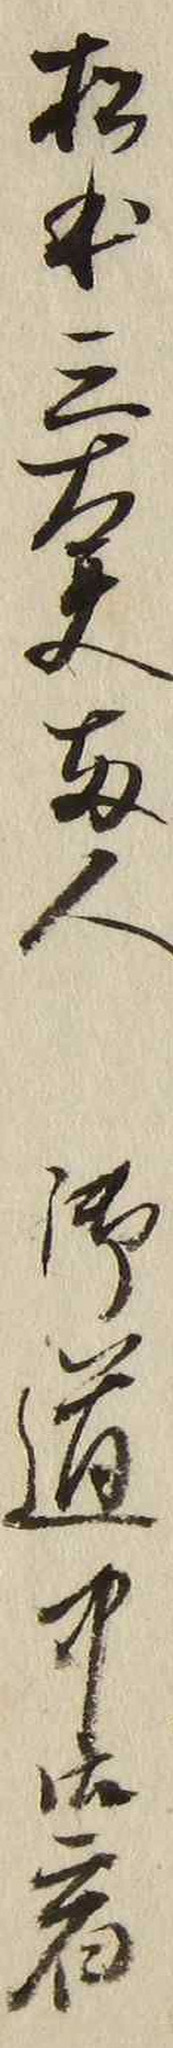松本三太夫両人御道中御宿

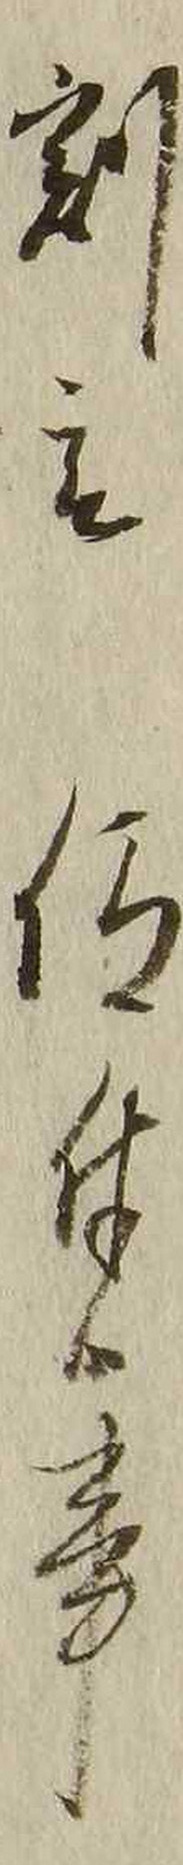割被仰付候事
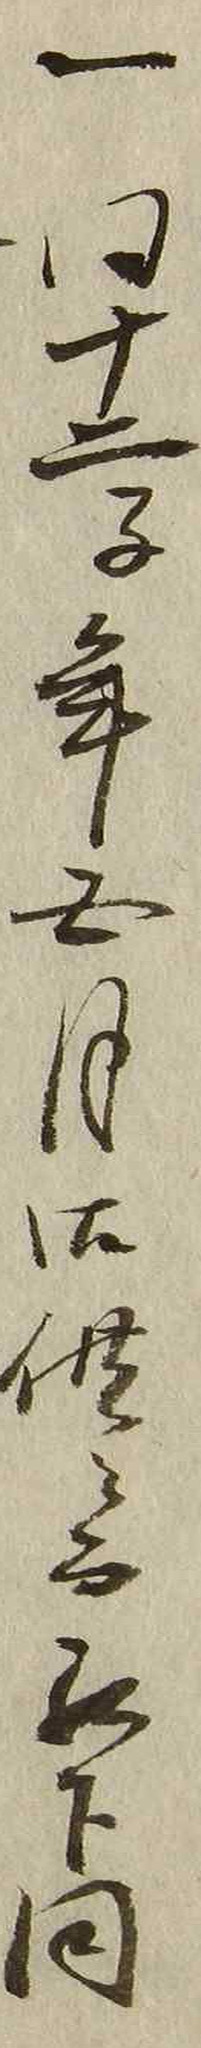一同十二子年五月御供ニ而罷下同
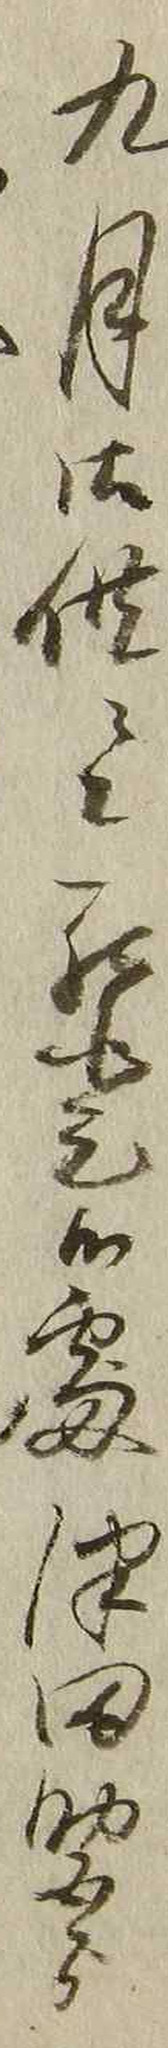九月御供ニ而罷登候処津田助五郎
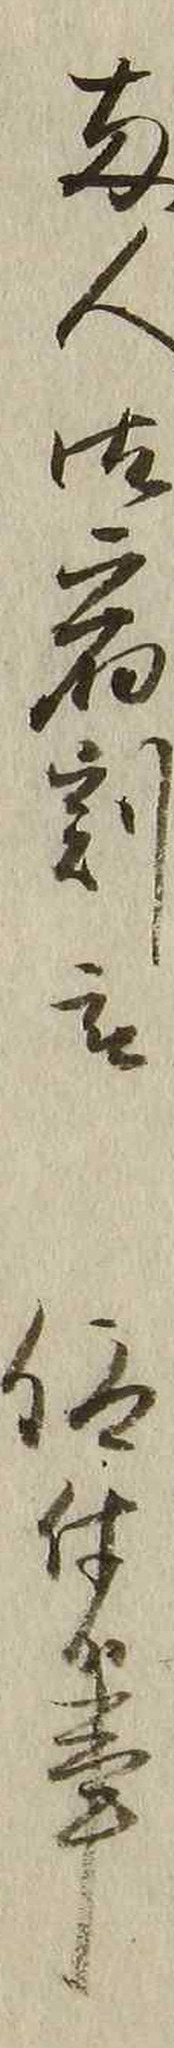両人御宿割被仰付候事
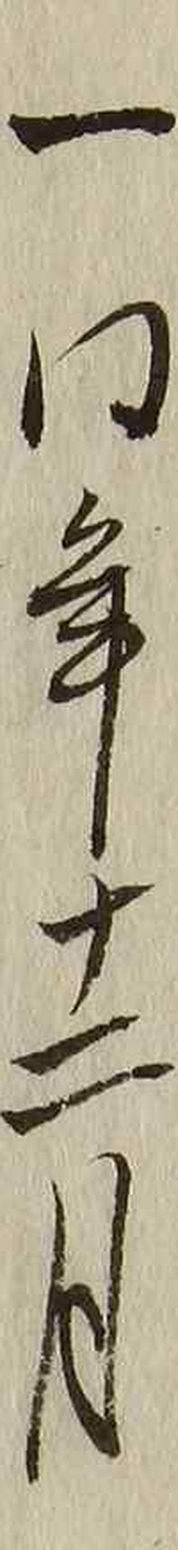一同年十二月
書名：諸士系譜　巻之352　す之部2
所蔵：会津若松市立会津図書館
